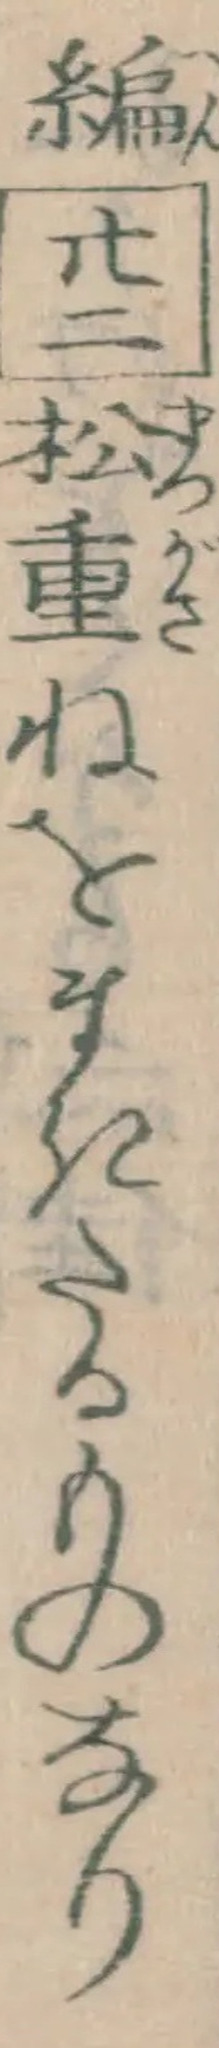編廿二松重ねをまきたるものなり
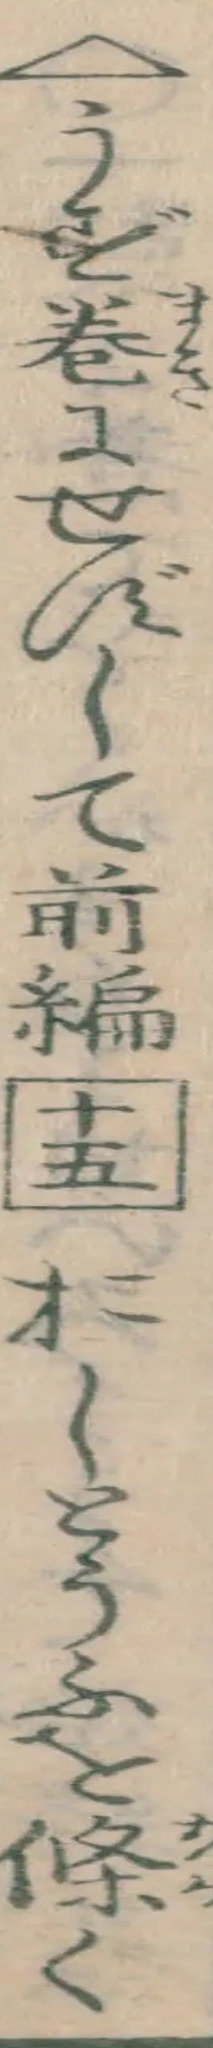△うず巻にせずして前編十五おしとうふを条く
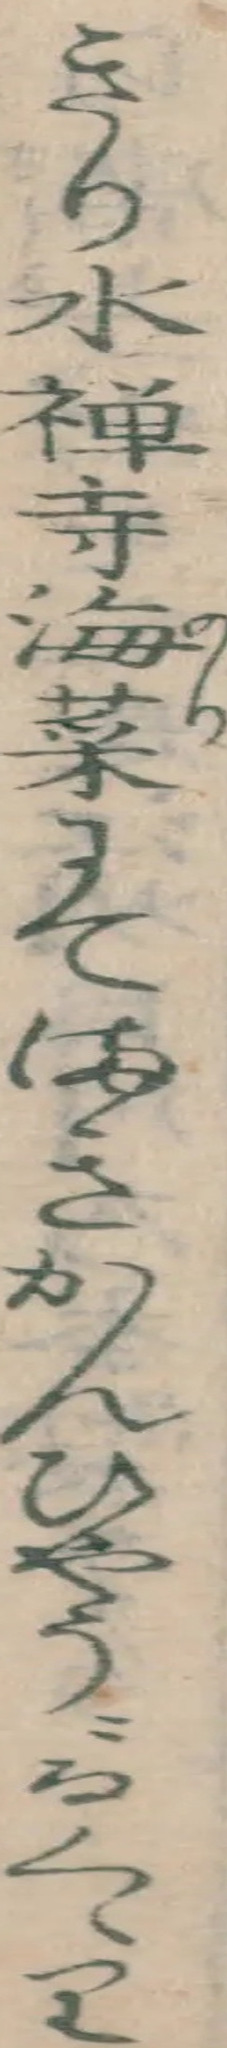きり水禅寺海菜にてまきかんひやうにてくゝり
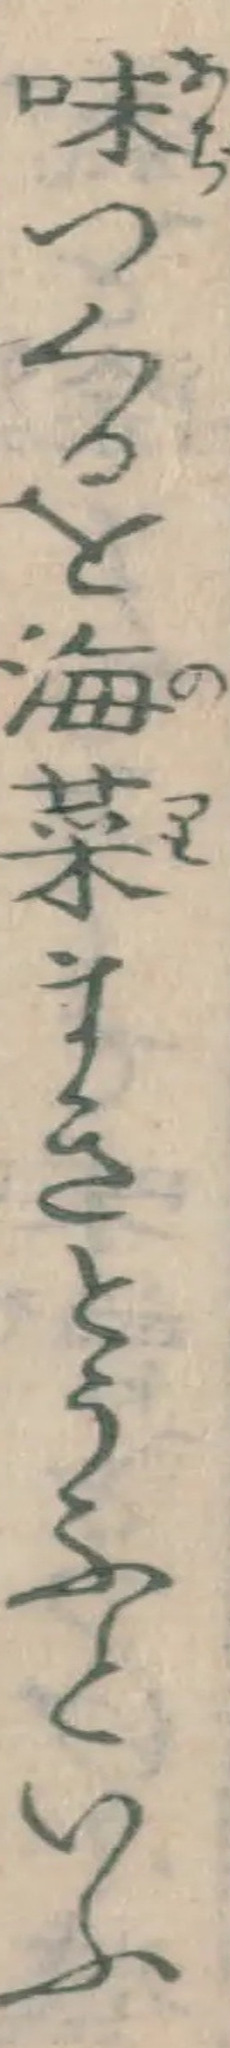味つくるを海菜まきとうふといふ
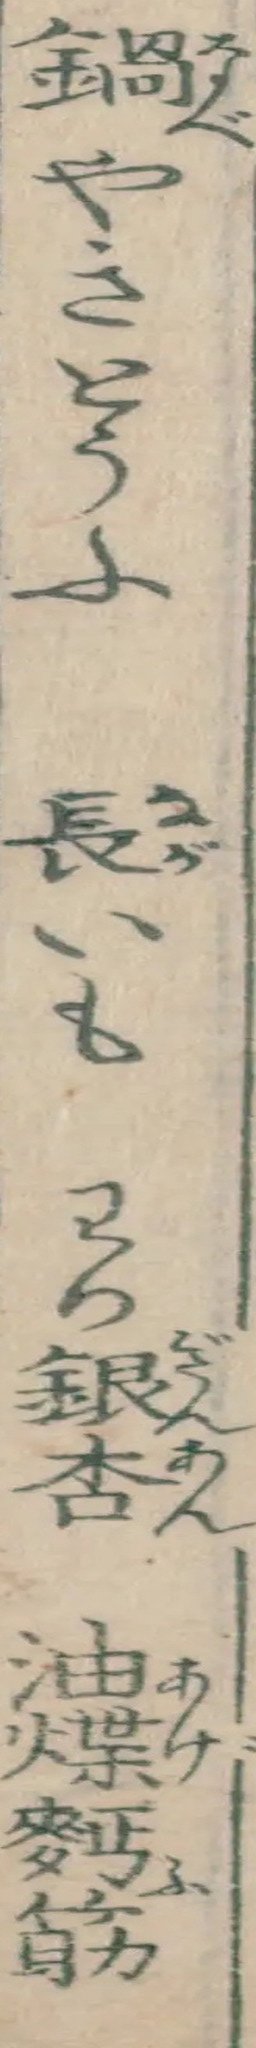四鍋やきとうふ長いもわり銀杏油煠麪筋
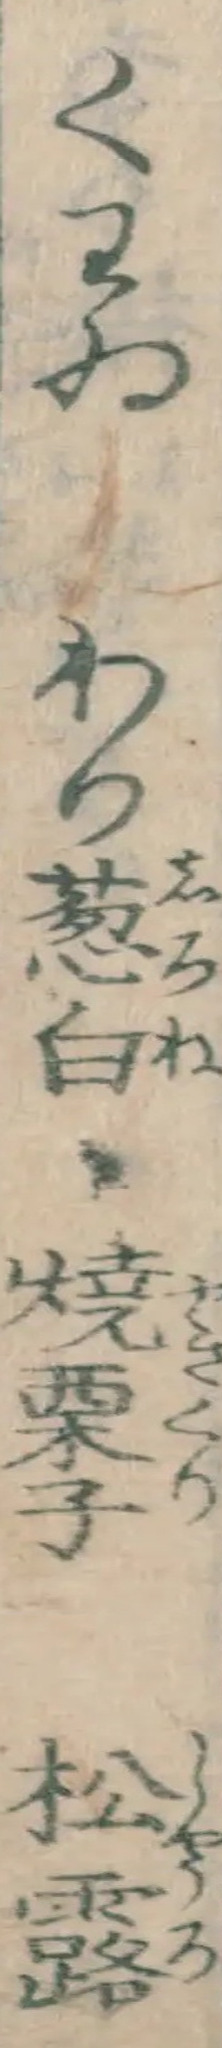木耳くわゐわり葱白焼栗子松露
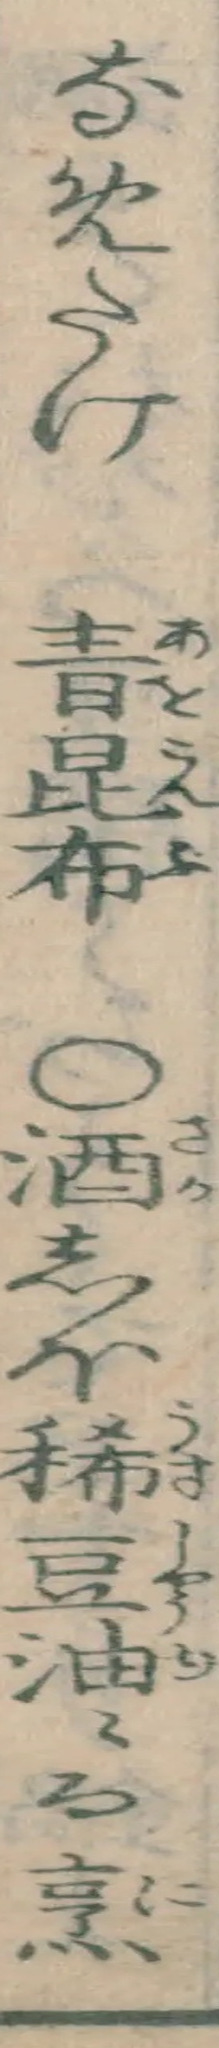なめたけ青昆布○酒しほ稀豆油にて烹

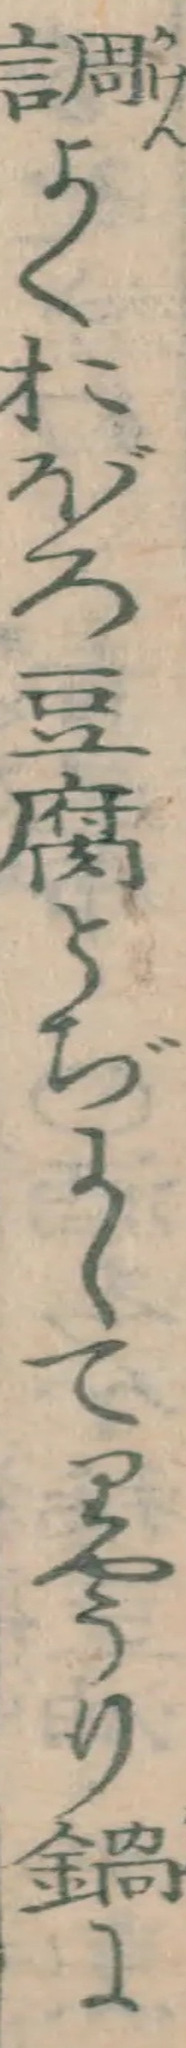調よくおぼろ豆腐とぢにしてりやうり鍋に
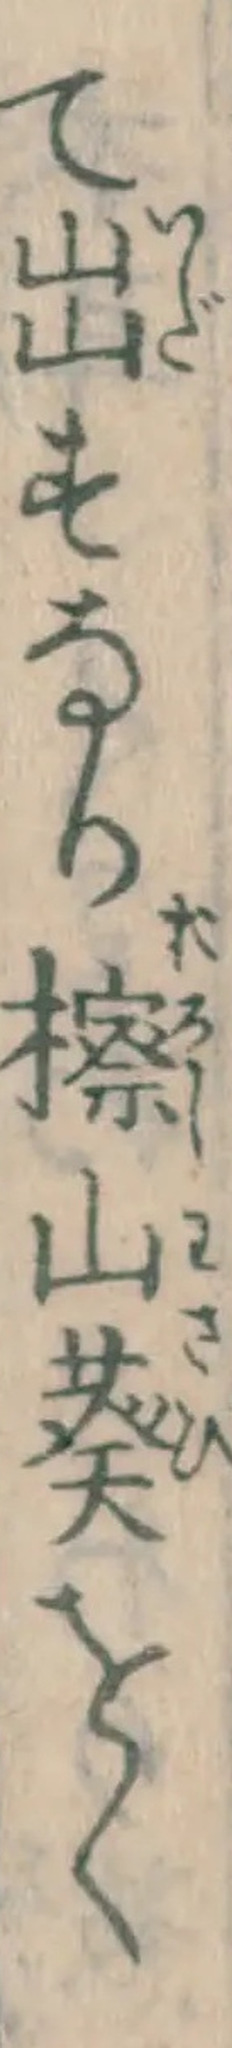て出すなり擦山葵をく
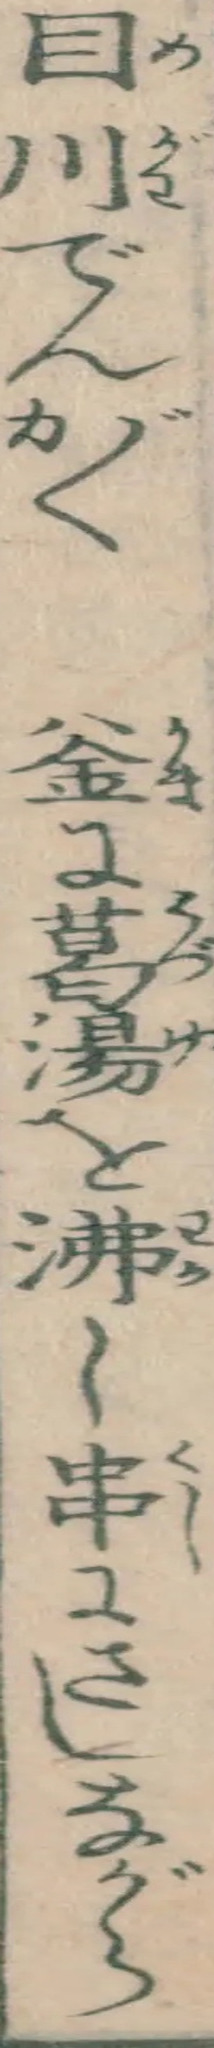五目川でんがく釜に葛湯を沸し串にさしながら
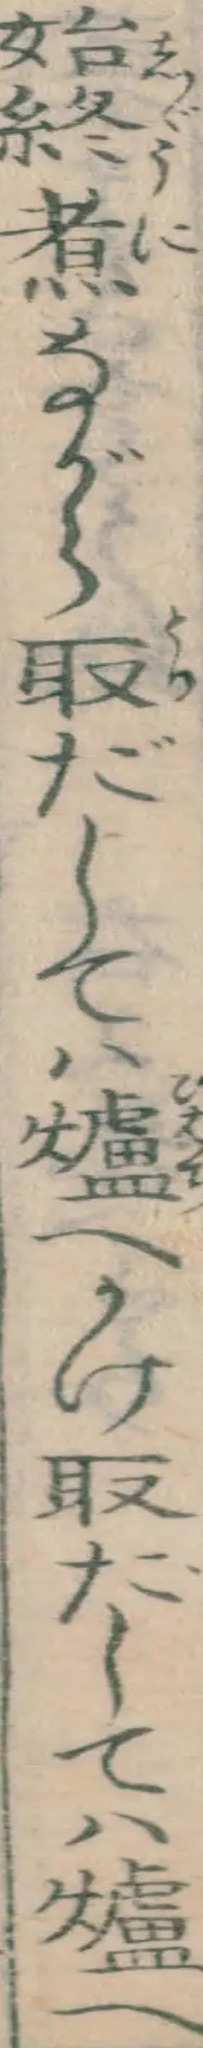始終煮ながら取だしては炉へかけ取だしては炉へ
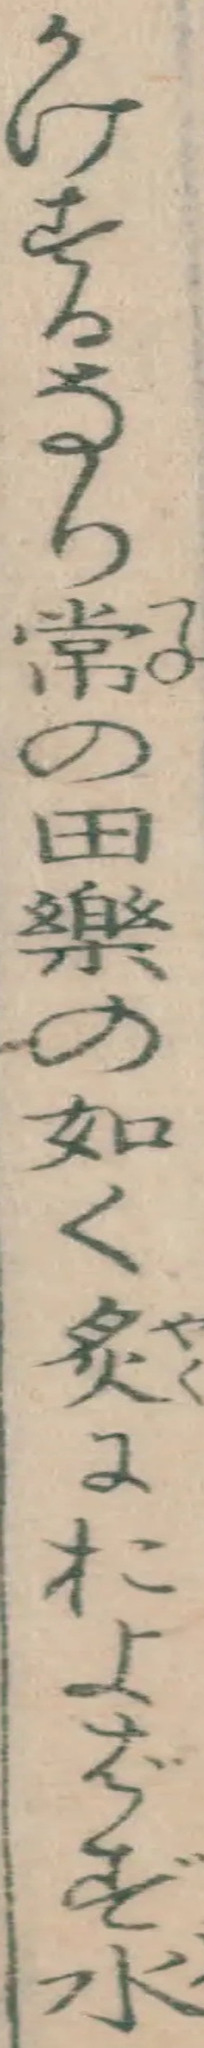かけするなり常の田楽の如く炙におよばず水
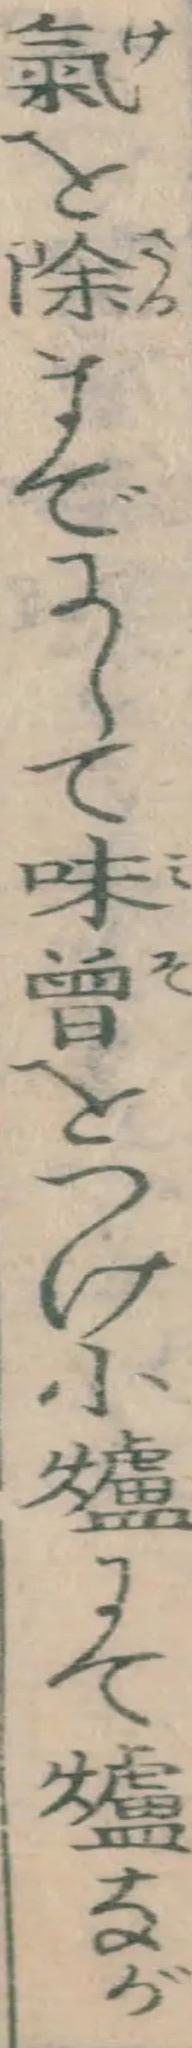気を除までにして味曽をつけ小炉にて炉なが
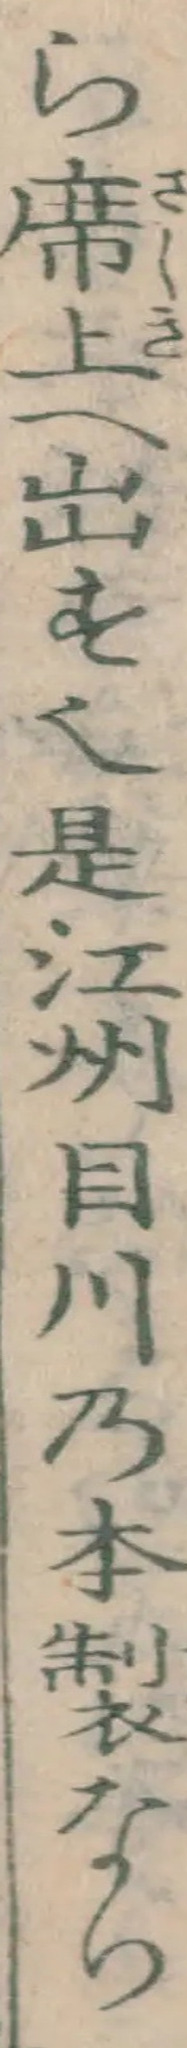ら席上へ出す也是江州目川の本製なり
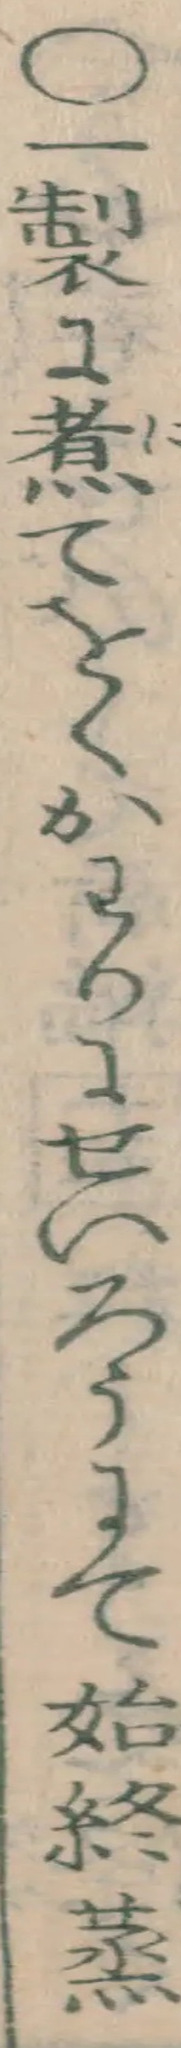○一製に煮てをくかわりにせいろうにて始終蒸
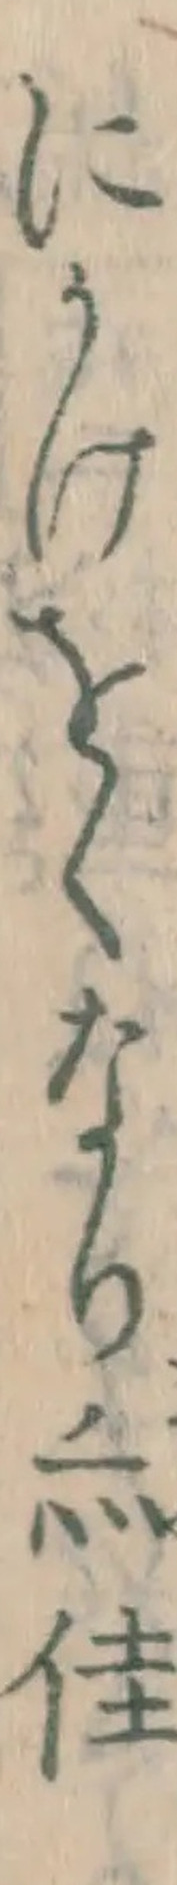にかけをくなり亦佳
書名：豆腐百珍. 続編
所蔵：国立国会図書館 National Diet Library, JAPAN
